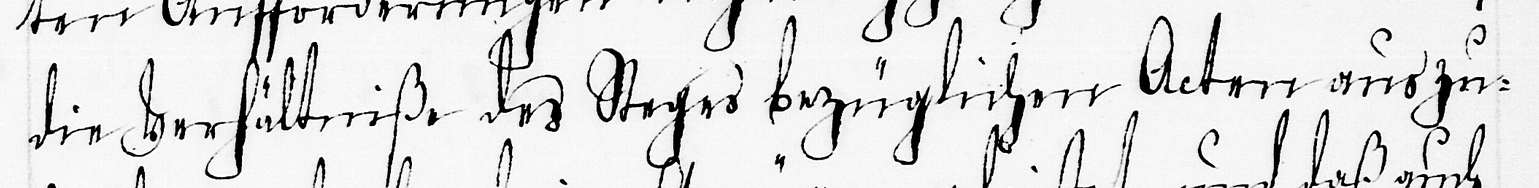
die Verhältniße des Steges bezüglichen Acten auszu¬
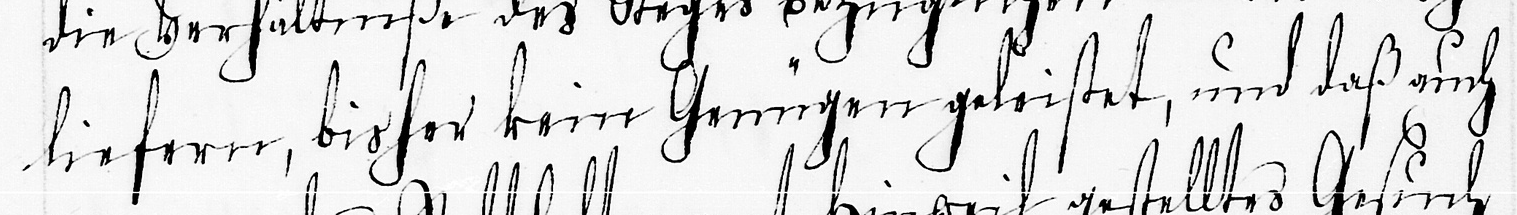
liefern, bisher kein Genügen geleistet, und daß auch
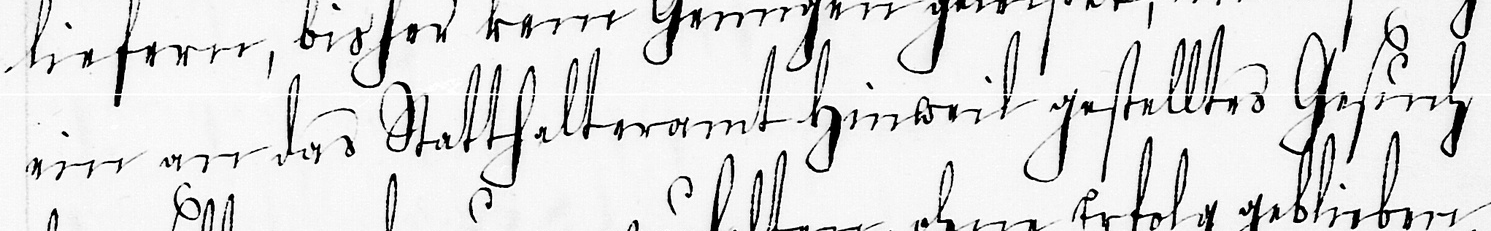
ein an das Statthalteramt Hinweil gestelltes Gesuch
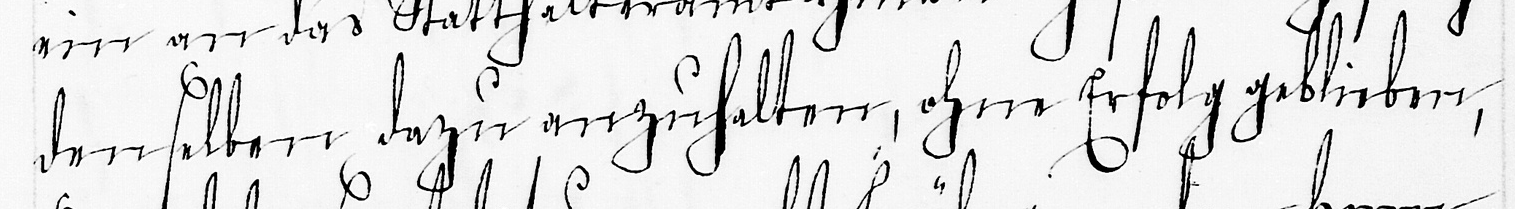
denselben dazu anzuhalten, ohne Erfolg geblieben,
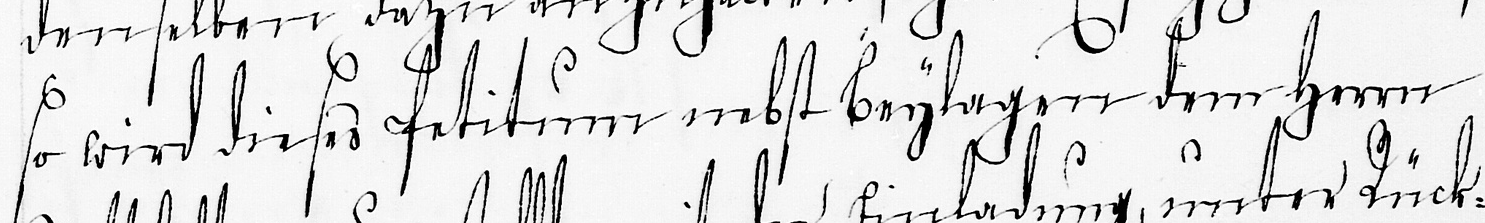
so wird dieses Petitum nebst Beylagen dem Herrn
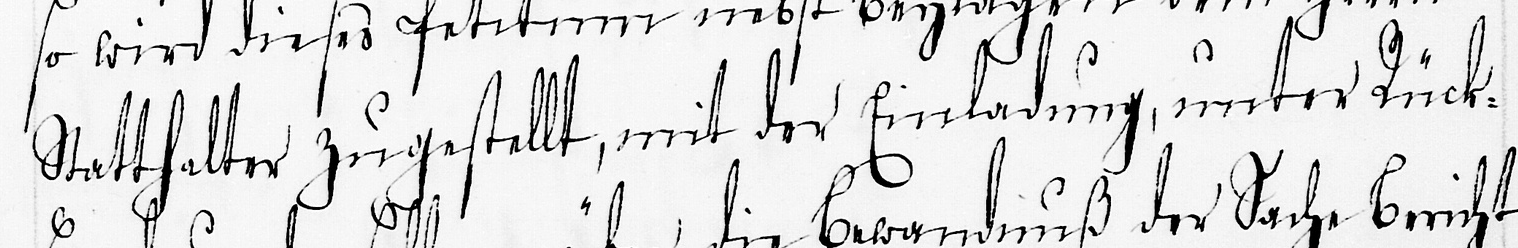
Statthalter zugestellt, mit der Einladung, unter Rück¬
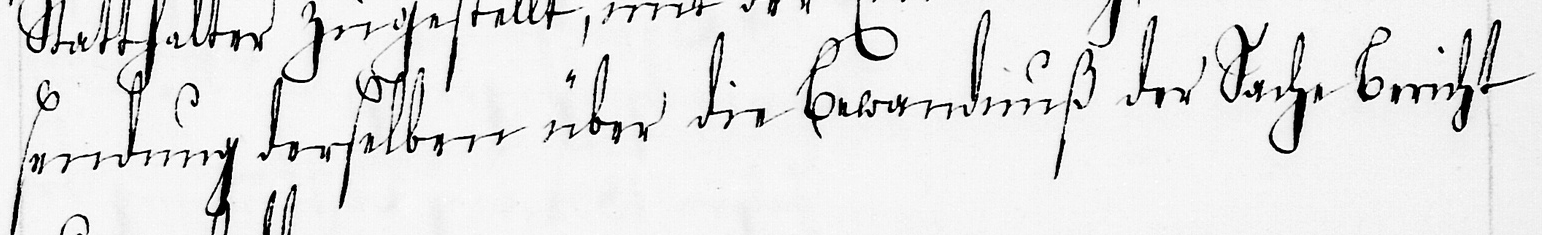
sendung derselben über die Bewandnuß der Sache Bericht
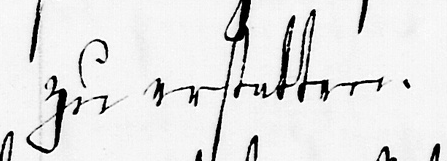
zu erstatten.
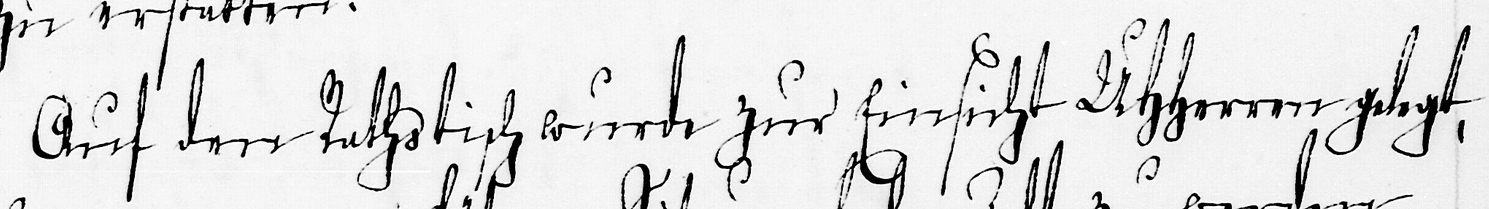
Auf den Rathstisch wurde zur Einsicht UHHerren geleg¬
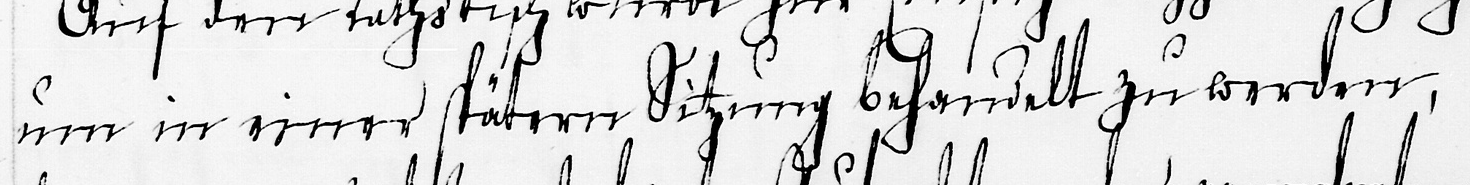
um in einer spätern Sitzung behandelt zu werden,
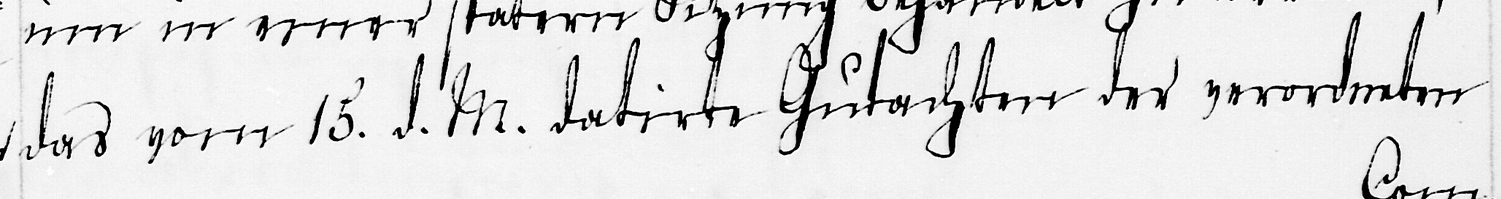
das vom 15. d. M. datirte Gutachten der verordneten
